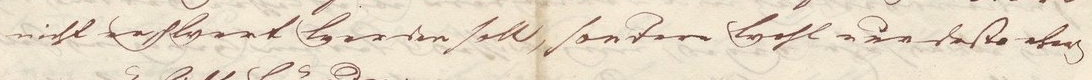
nicht erschwert werden soll, sondern wohl nur desto eher
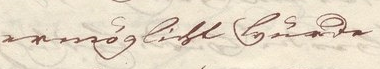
ermöglicht würde.
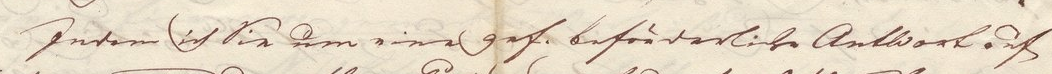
Indem ich Sie um eine gef. beförderliche Antwort auf
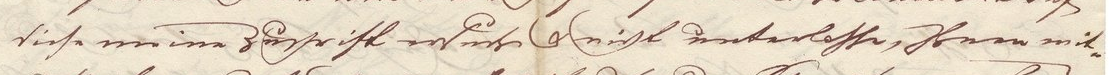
diese meine Zuschrift ersuche & nicht unterlasse, Ihnen mit-
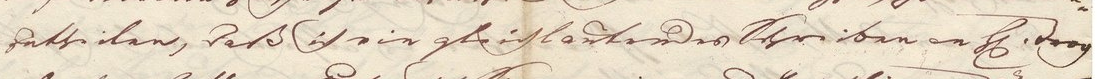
zutheilen, daß ich ein gleichlautendes Schreiben an H. Trog
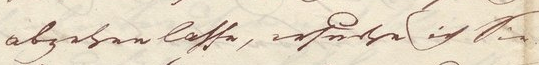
abgehen lasse, ersuche ich Sie
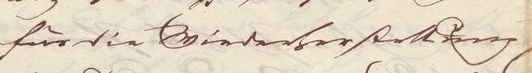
für die Wiederherstellung
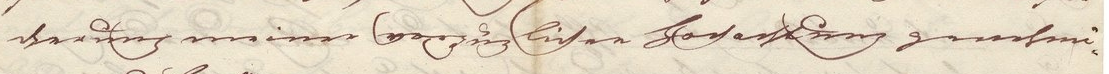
cherung meiner vorzüglichen Hochachtung genehmi-
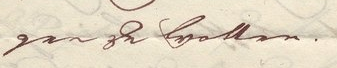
gen zu wollen.
